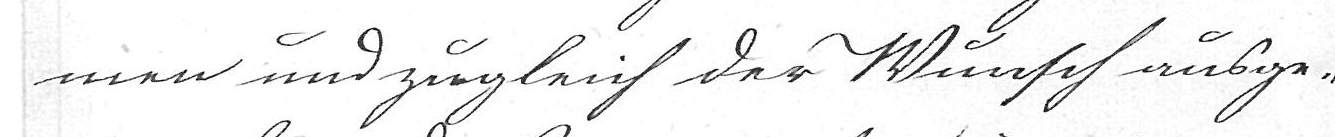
men und zugleich der Wunsch ausge-
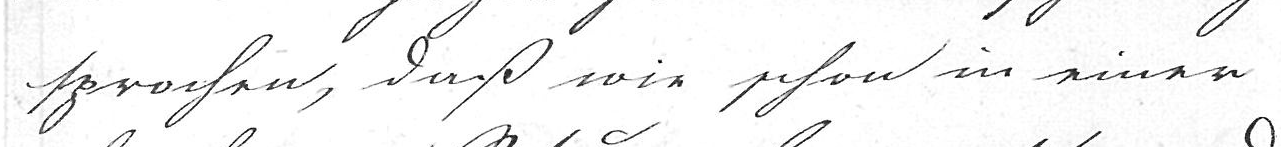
sprochen, daß wie schon in einer
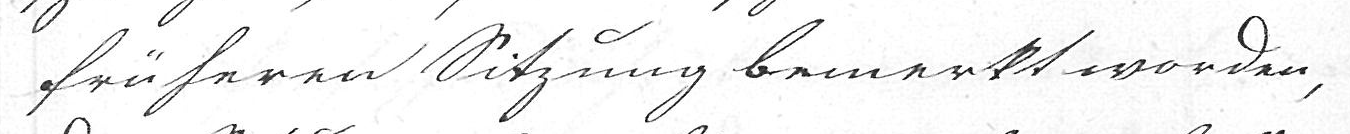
früheren Sitzung bemerkt worden,
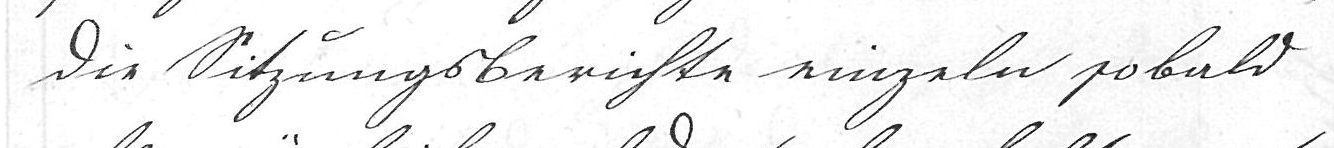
die Sitzungsberichte einzeln sobald
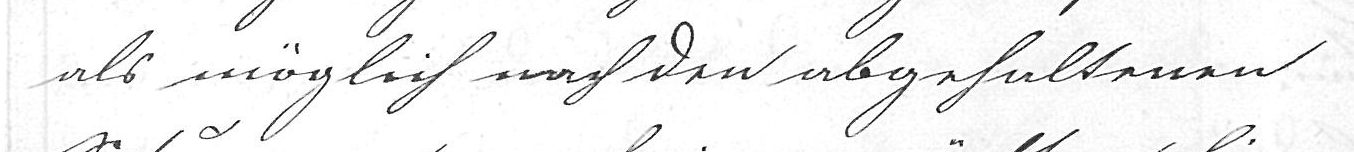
als möglich nach den abgehaltenen
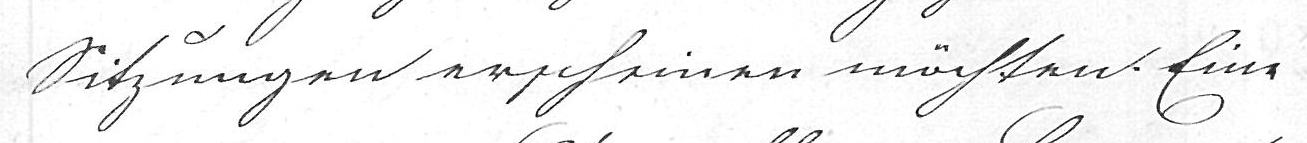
Sitzungen erscheinen möchten. Eine
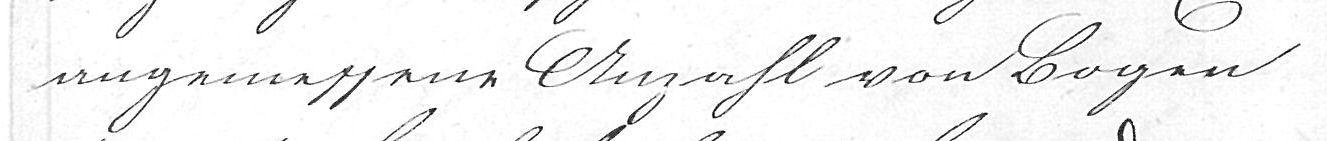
angemessene Anzahl von Bogen
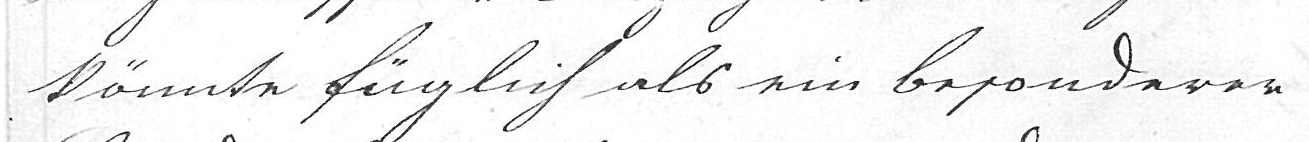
könnte füglich als ein besonderer
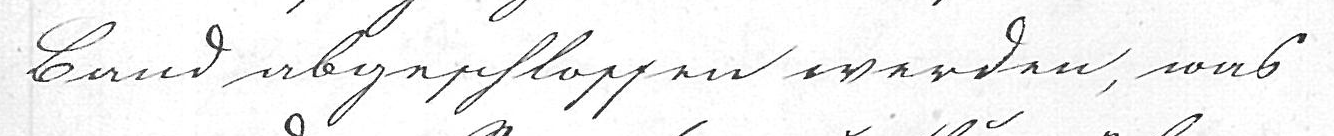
Band abgeschlossen werden, was
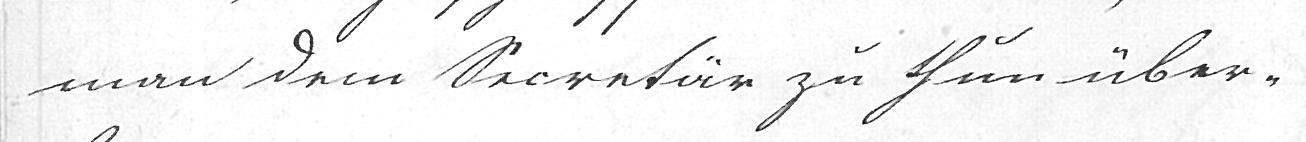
man dem Secretär zu thun über-
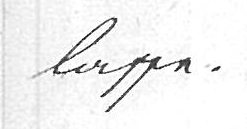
lasse.
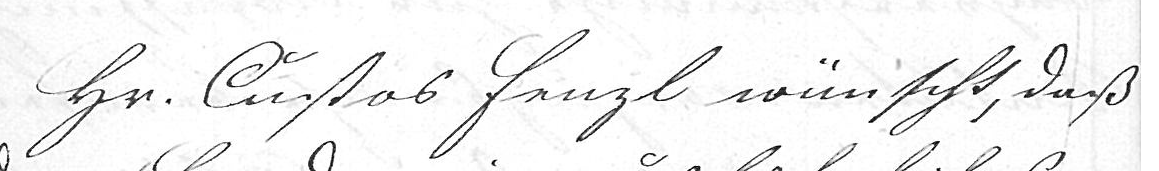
Hr. Custos Fenzl wünscht, daß
